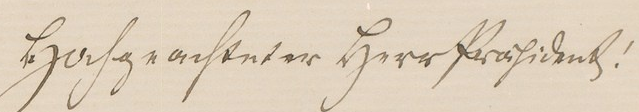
Hochgeachteter Herr Präsident!
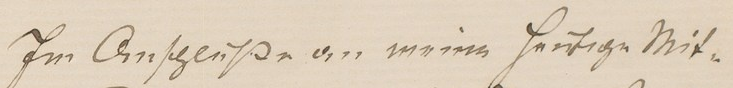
Im Anschluße an meine heutige Mit-
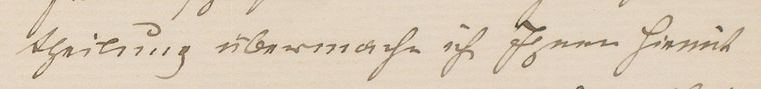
theilung übermache ich Ihnen hiemit
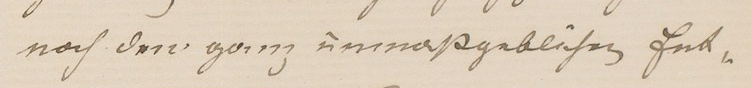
noch den ganz unmaßgeblichen Ent-
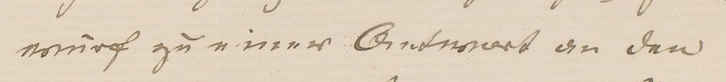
wurf zu meiner Antwort an den
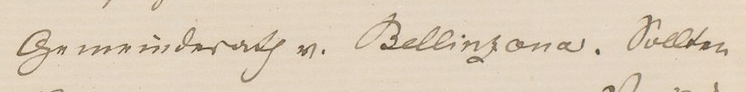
Gemeinderath v. Bellinzona. Sollten
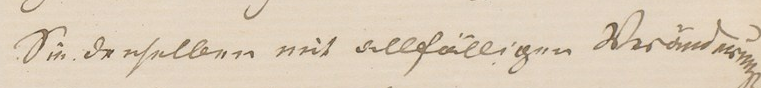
Sie denselben mit allfälligen Veränderungen
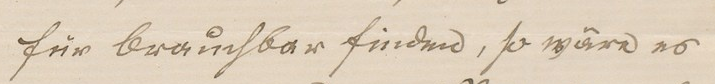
für brauchbar finden, so wäre es
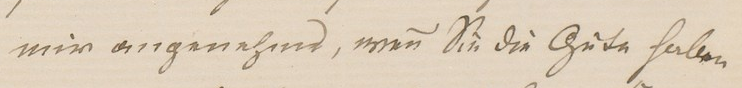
mir angenehm, wenn Sie die Güte haben
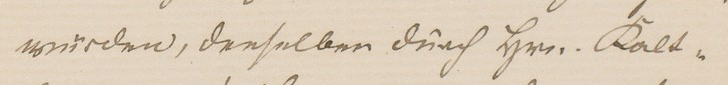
würden, denselben durch Hrn. Kalt-
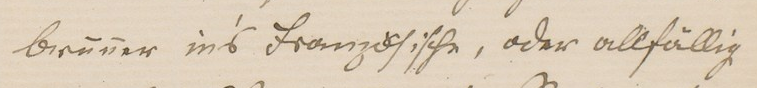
brunner ins' Französische, oder allfällig
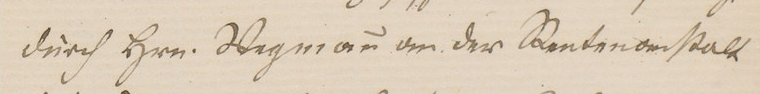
durch Hrn. Wegmann an der Rentenanstalt
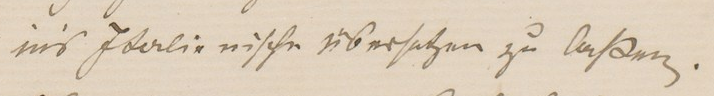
ins' Italiensiche übersetzen zu laßen.
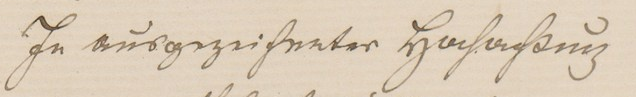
In ausgezeichneter Hochachtung
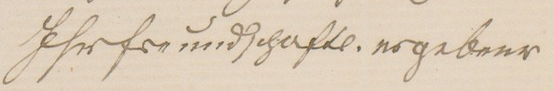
Ihr freundschaftl. ergebener
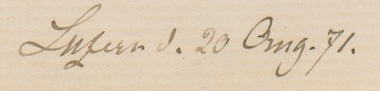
Luzern d. 20 Aug. 71.
